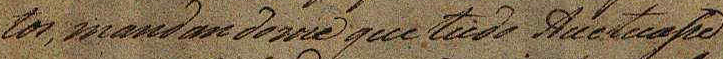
tos, mandando me que tudo Auctuasse
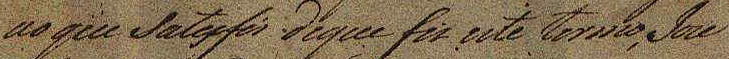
ao que Satisfis de que fiz este termo, Ioze
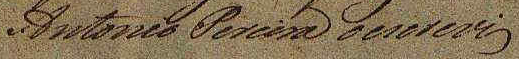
Antonio Pereira o escrevi
